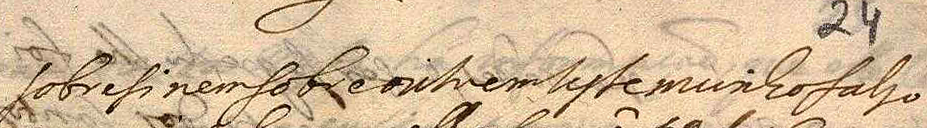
sobre si nem sobre outrem testemunho falso
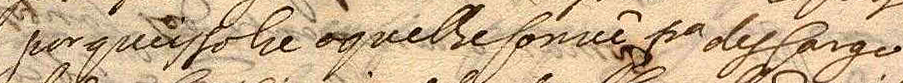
porque isso he o que lhe Couuē pa desCargo
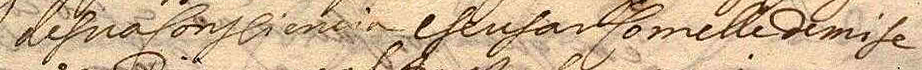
de sua Consciencia e se usar Com elle de mise
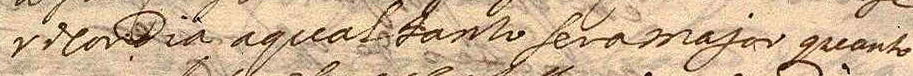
ricordia a qual tanto sera major quanto
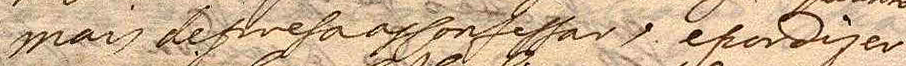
mais depresa as Confessar /. e por dizer
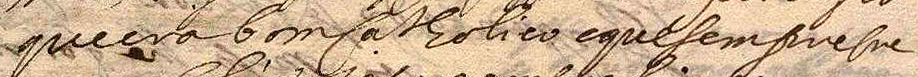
que era bom Catholico e que sempre Cre
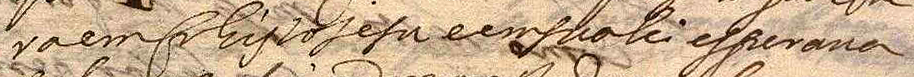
ra em Crhisto jesu e em sua lei esperaua
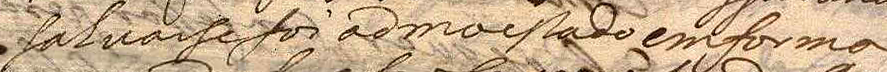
saluarse foi admoestado em forma
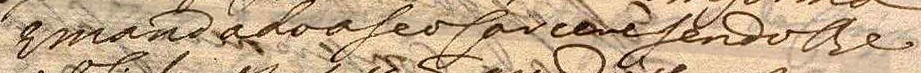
E mandado a seo Carcere sendolhe
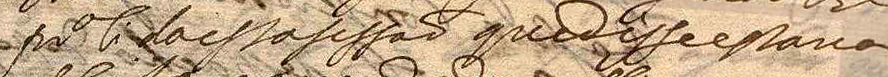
pro lida esta sessaõ que disse estaua
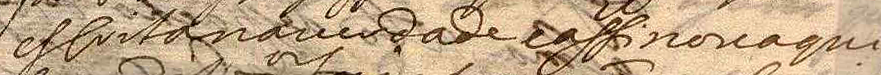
esCrita na uerdade e assinou aqui
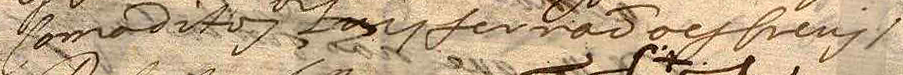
Com o dito sor Luis ferraõ o esCreuj /
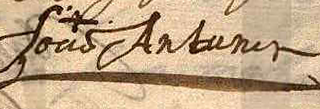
Joaõ Antunes
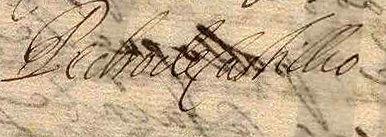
Pedro de Castilho
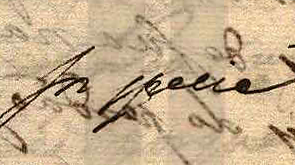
Jn specie
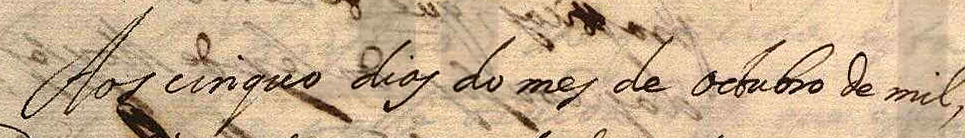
Aos cinquo dias do mes de octubro de mil,
